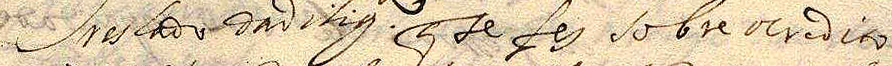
Treslado da dilig.a q̄ se fes sobre o credito
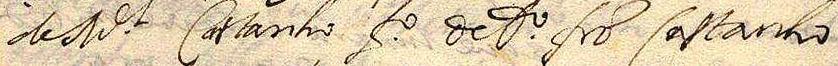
de M.el Castanho f.o de D.o frz̄ Castanho
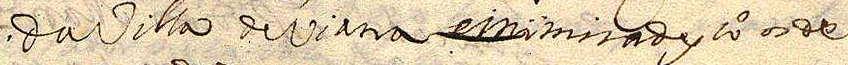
da villa da vianna e inimizades cō os de
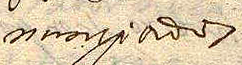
nunciados
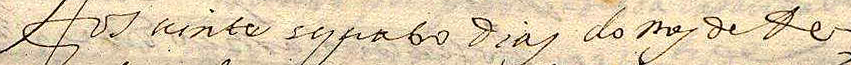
Aos uinte E quatro dias do mes de De
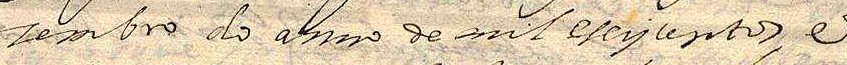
zembro do anno de mil e seiscentos, e
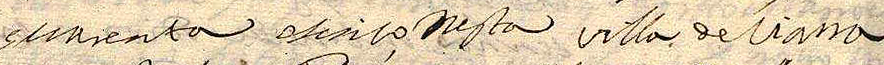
quarenta E sinco, nesta villa de viana
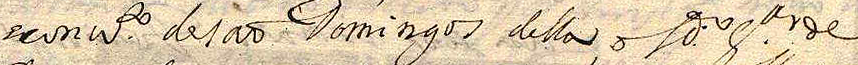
E conv.to de saõ Domingos della o Ld.o G.ar de
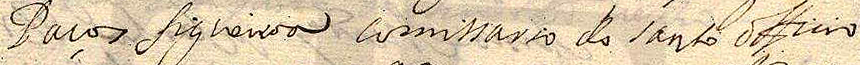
Paços figueiroa comissario do santo officio
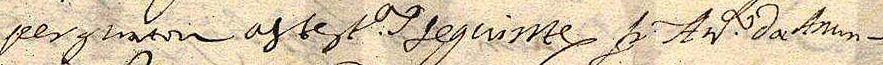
perguntou as test.as seguintes fr̄. An.to da Anun
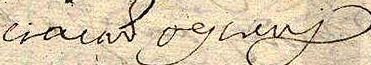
ciacaõ o escreuj
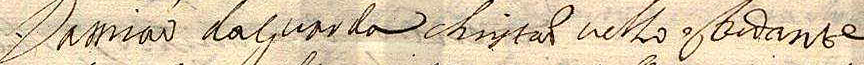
Damiaõ da Guarda christaõ uelho estudante
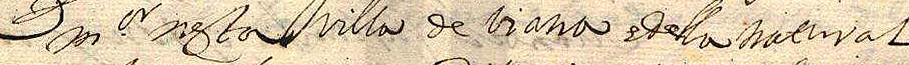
m.or nesta villa de viana E della naturaL
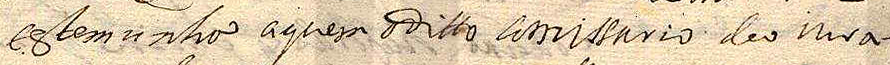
testemunha a quem o ditto comissario deo iura
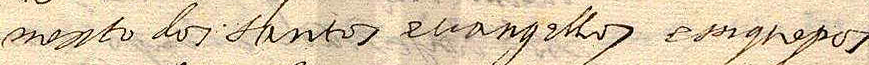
mento dos santos euangelhos em que pos
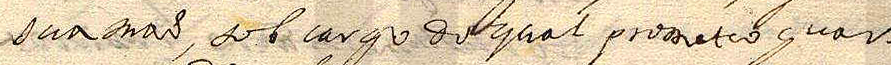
sua maõ, sob cargo do quaL prometeo guar
